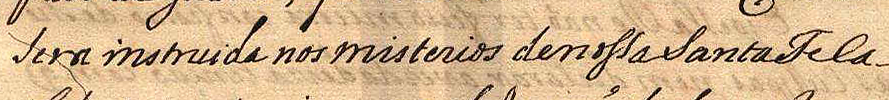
sera instruida nos misterios de nossa Santa Fe Ca
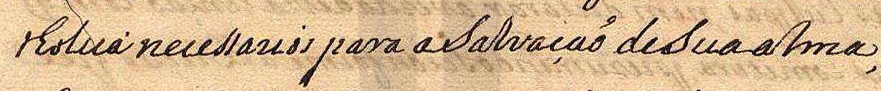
tholica necessarios para a Salvaçaõ de Sua alma,
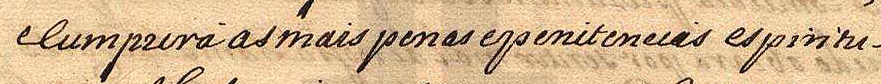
e cumprirá as mais penas e penitencias espiritu
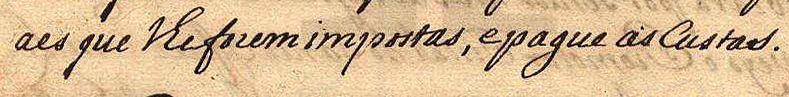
aes que lhe forem impostas, e pague as Custas.
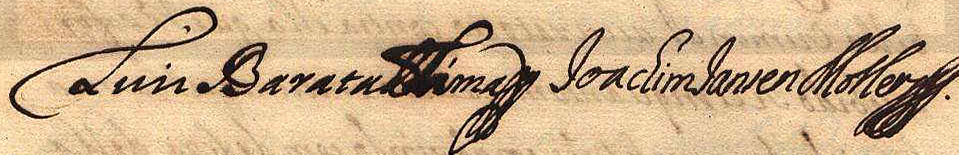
Luiz Barata d̄ Lima Ioachim Iansen Moller
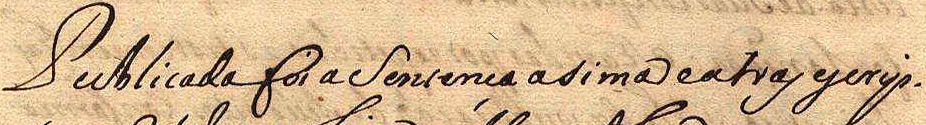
Pubblicada foi a Sentença asima, e atras escrip
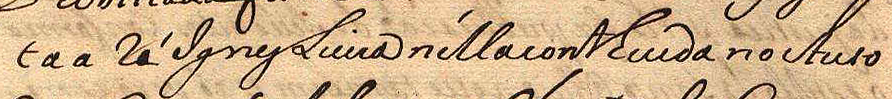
ta a Ré Ignes Luiza nella contheuda no Auto
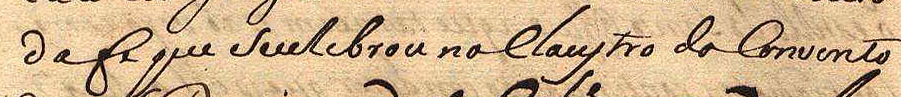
da fe que se celebrou no Claustro do Convento
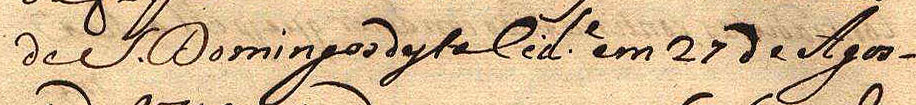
de S. Domingos desta Cid.e em 27 de Agos
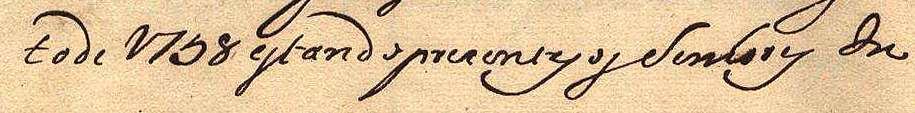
to de 1758 estando prezentes os Senhores In
